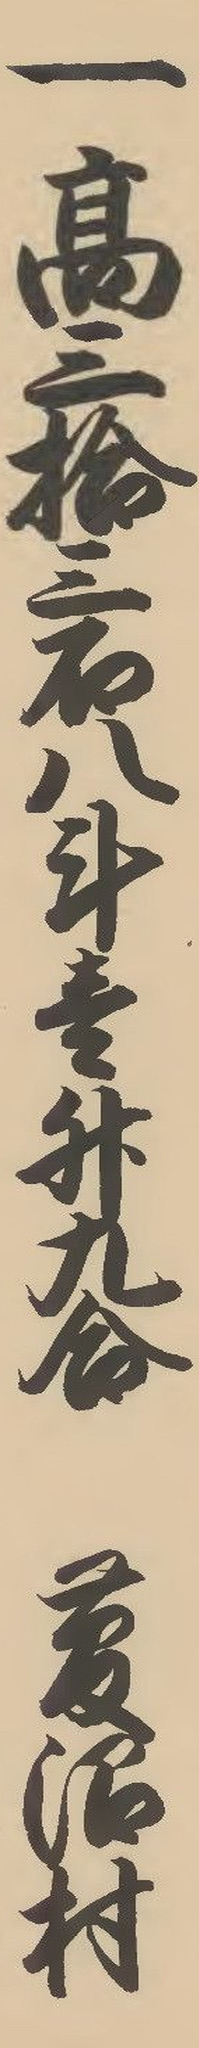一髙三拾三石八斗壱升九合菅沼村
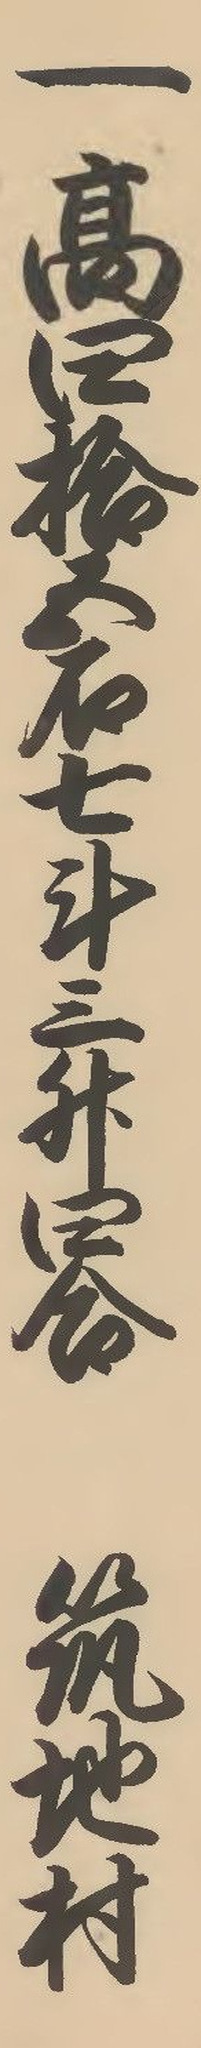一髙四拾五石七斗三升四合筑地村
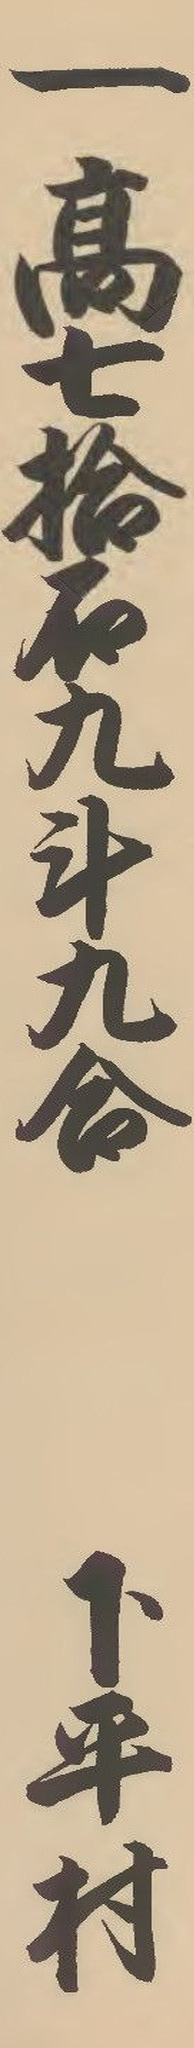一髙七拾石九斗九合下平村
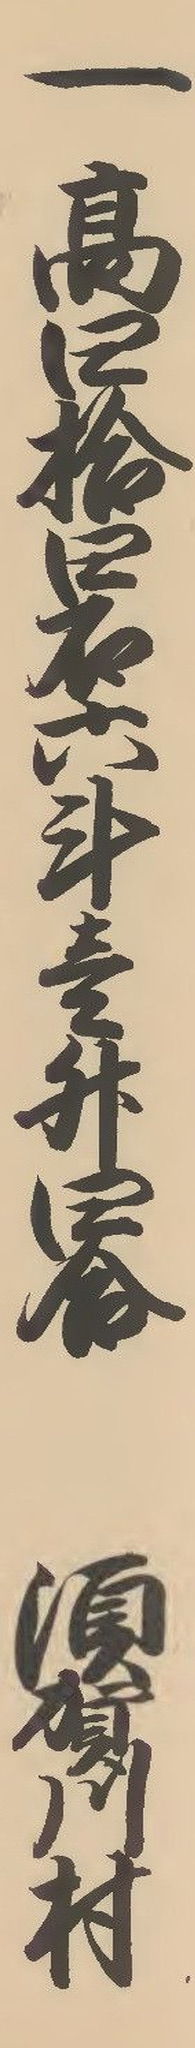一髙四拾四石六斗壱升四合須賀川村
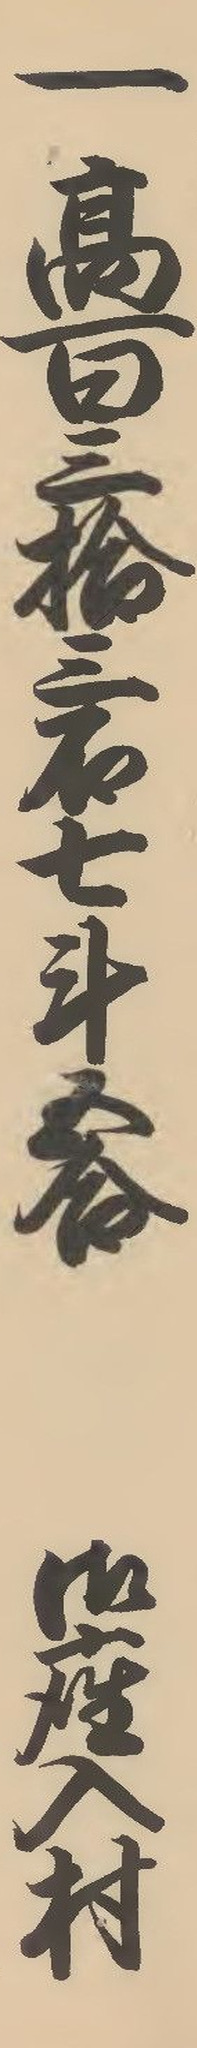一髙百三拾三石七斗五合御座入村
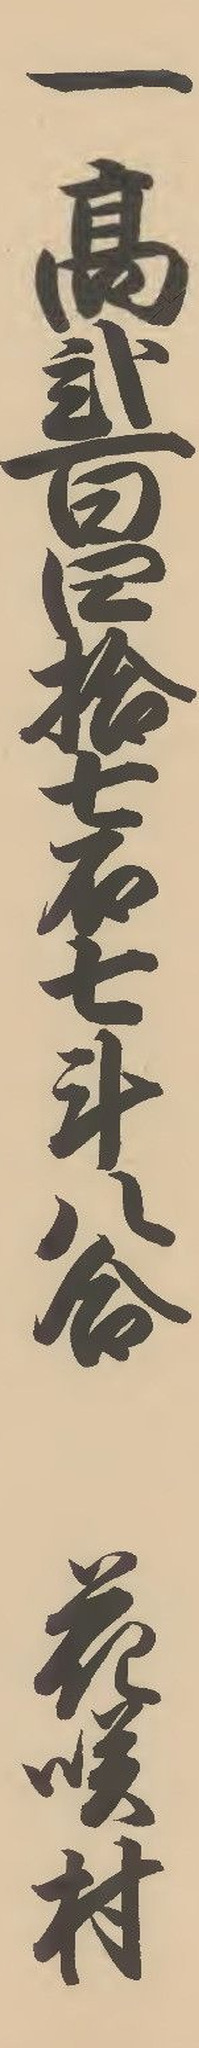一髙弐百四拾七石七斗八合花咲村
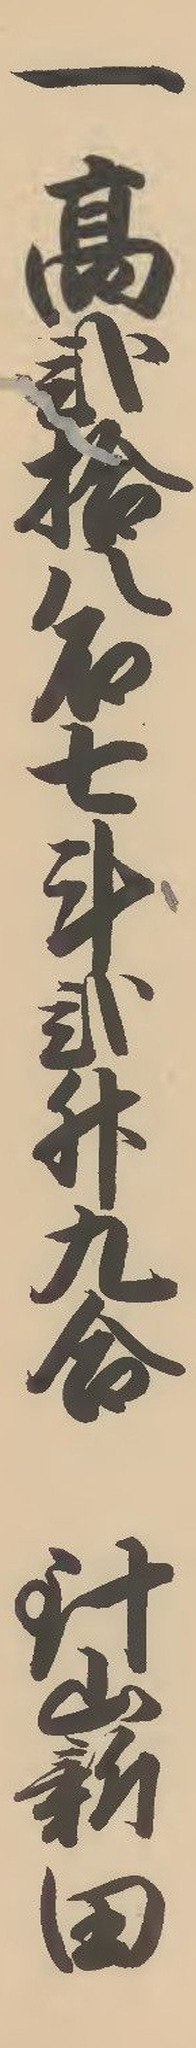一髙弐拾八石七斗弐升九合針山新田

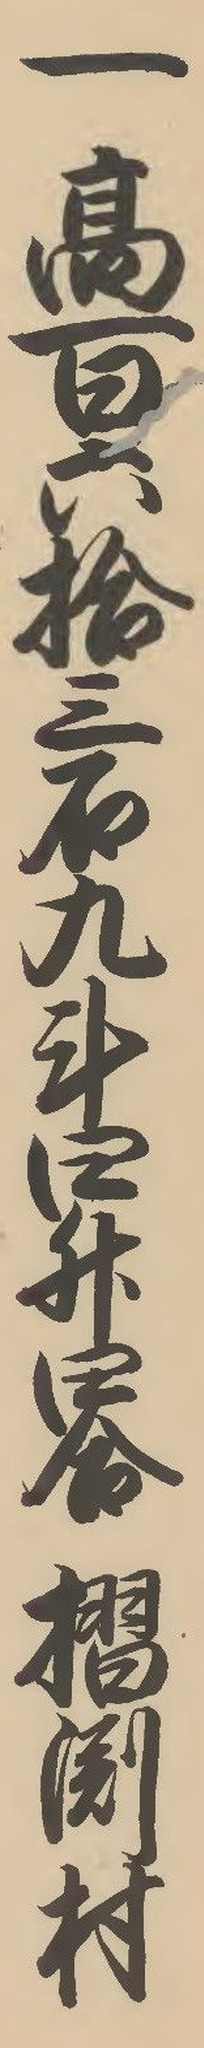一髙百六拾三石九斗四升四合摺渕村
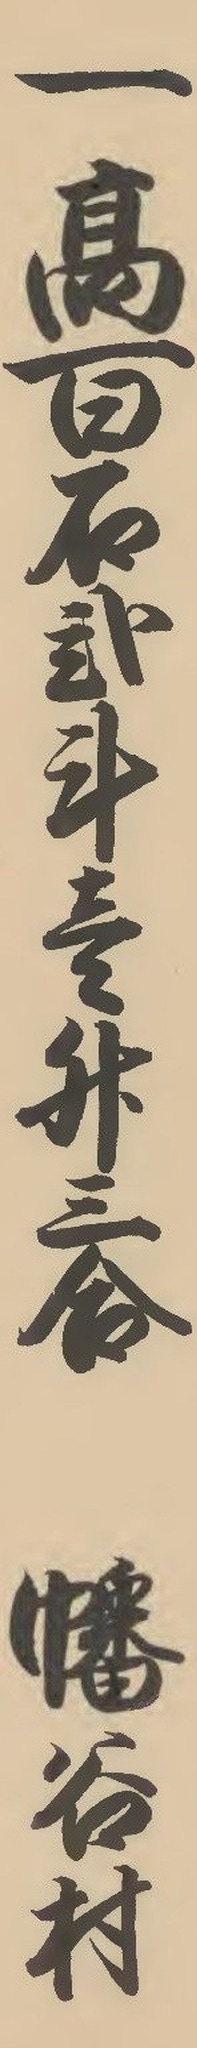一髙百石弐斗三升三合幡谷村
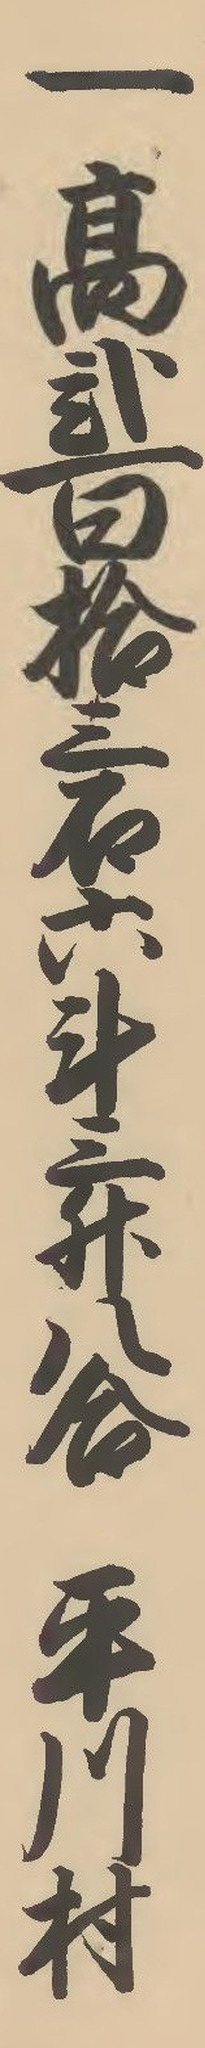一髙弐百拾三石六斗三升八合平川村
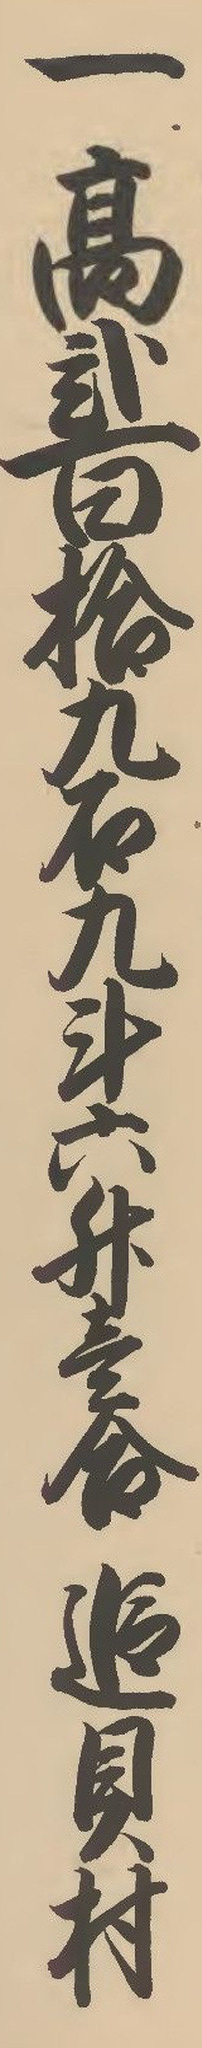一髙弐百拾九石九斗六升壱合追貝村
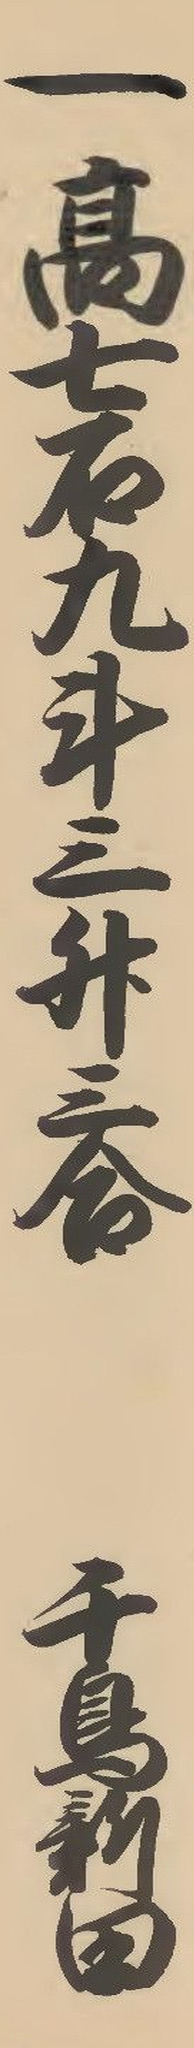一髙七石九斗三升三合千鳥新田
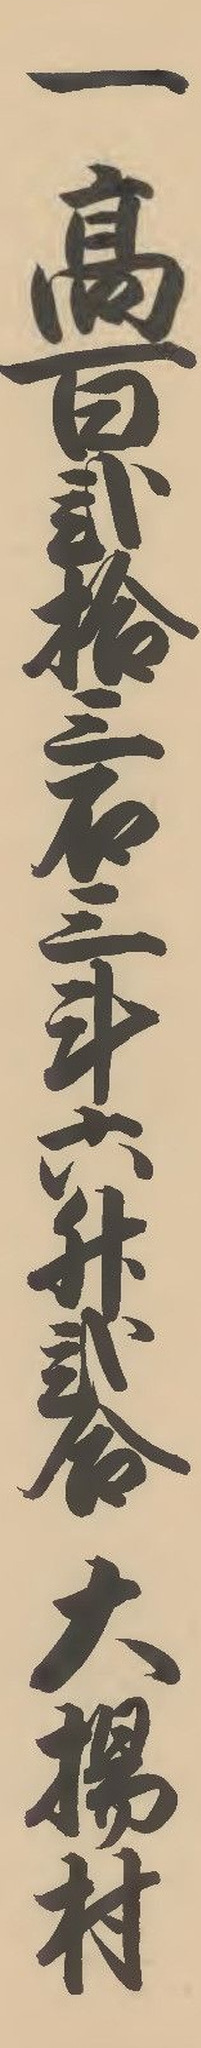一髙百弐拾三石三斗六升弐合大揚村
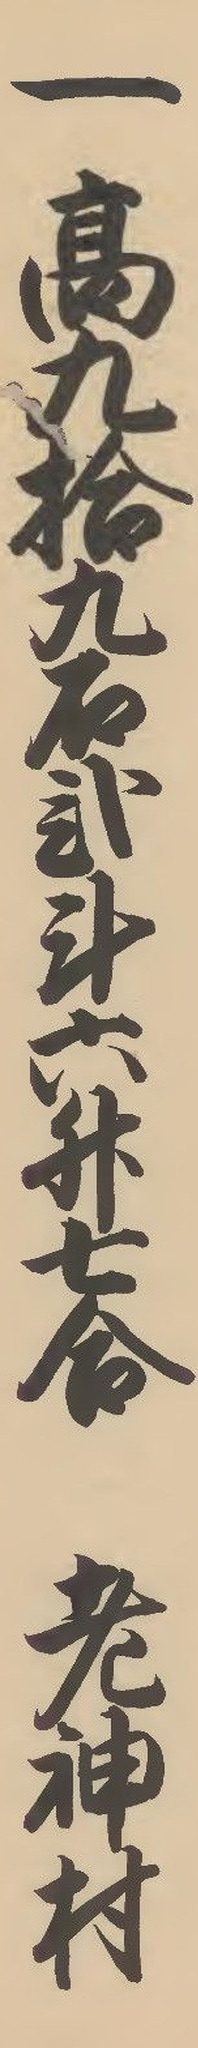一髙九拾九石弐斗六升七合老神村

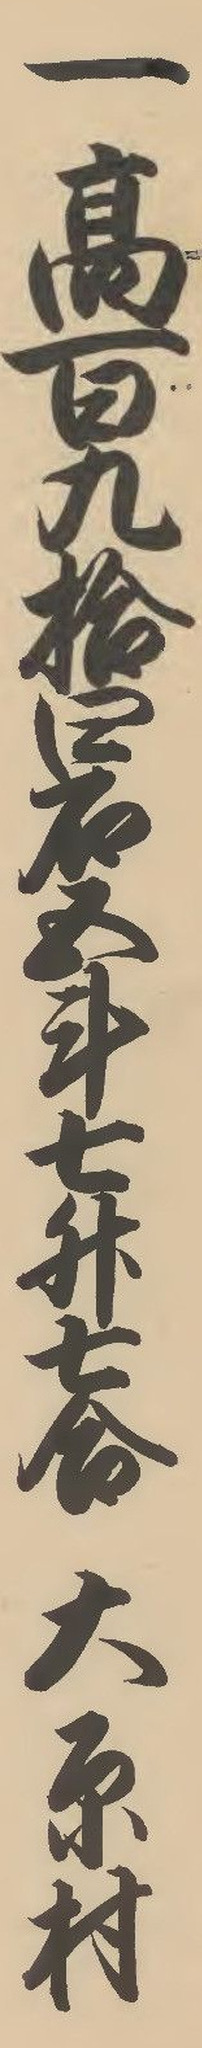一髙百九拾四石五斗七升七合大原村
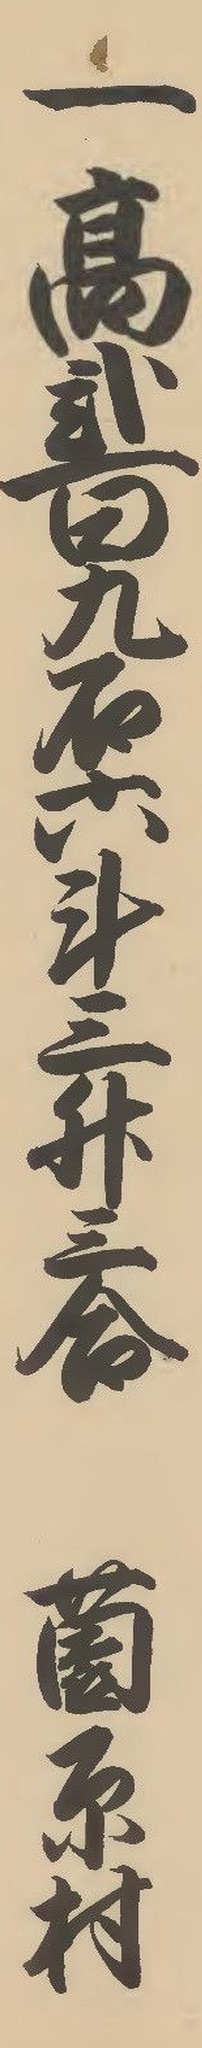一髙弐百九石六斗三升三合薗原村
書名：上野国郷帳
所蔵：国立公文書館 National Archives of Japan
